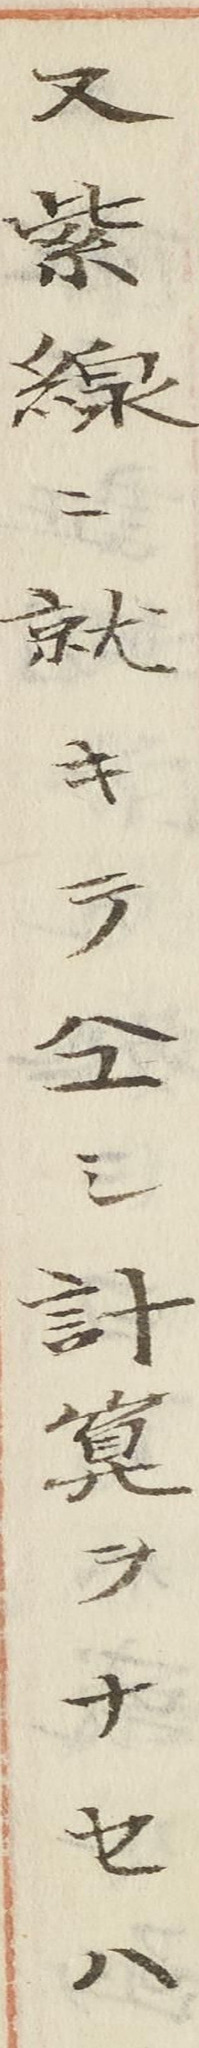又紫線ニ就キテ同シ計算ヲナセハ
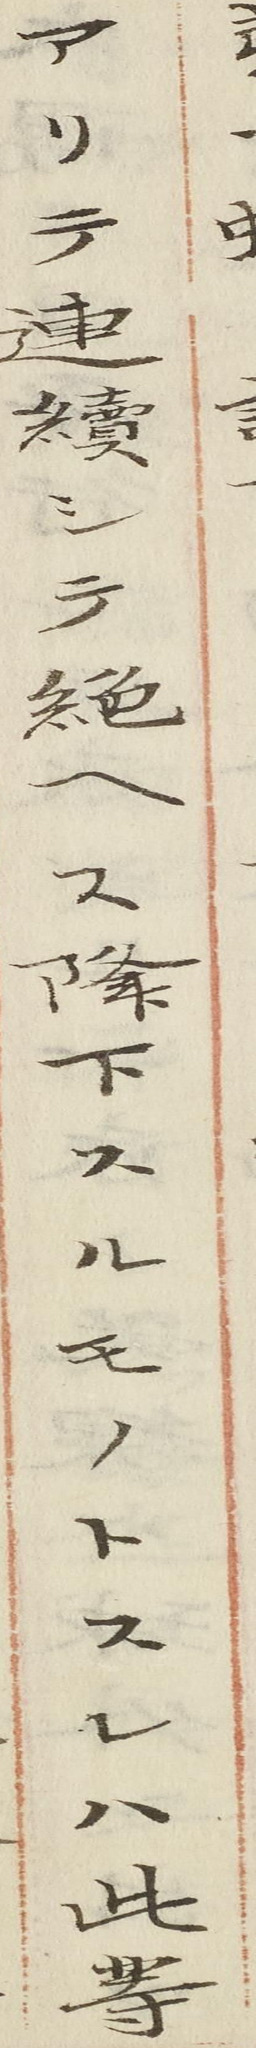アリテ連続シテ絶ヘス降下スルモノトスレハ此等
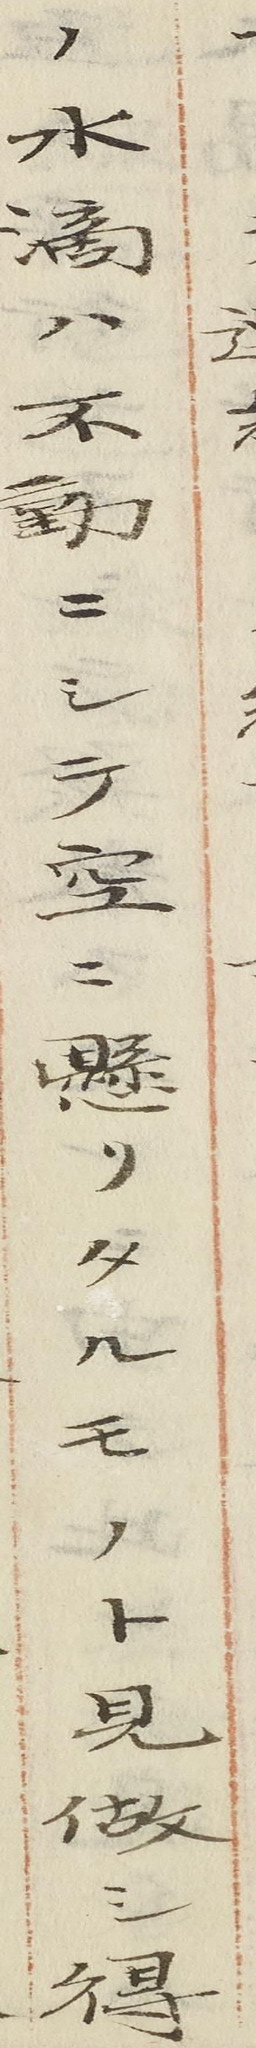ノ水滴ハ不動ニシテ空ニ懸リタルモノト見做シ得
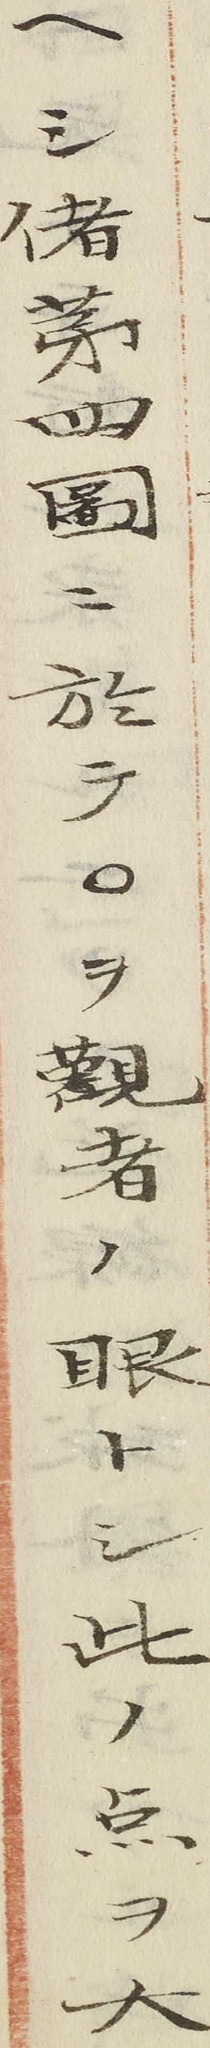ヘシ偖第四図ニ於テヲ観者ノ眼トシ此ノ点ヲ大
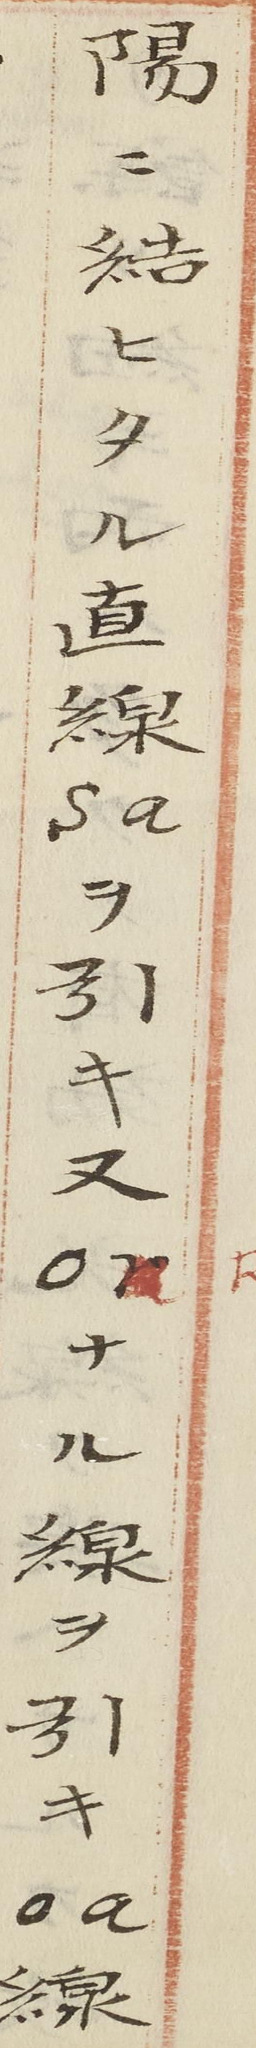陽ニ結ヒタル直線ヲ引キ又ナル線ヲ引キ線
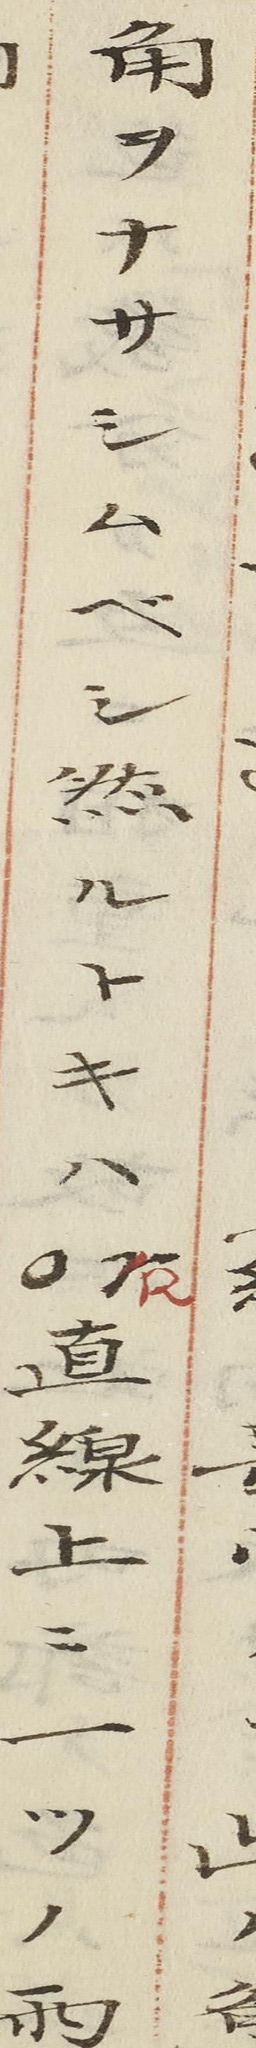角ヲナサシムベシ然ルトキハ直線上ニ一ツノ雨
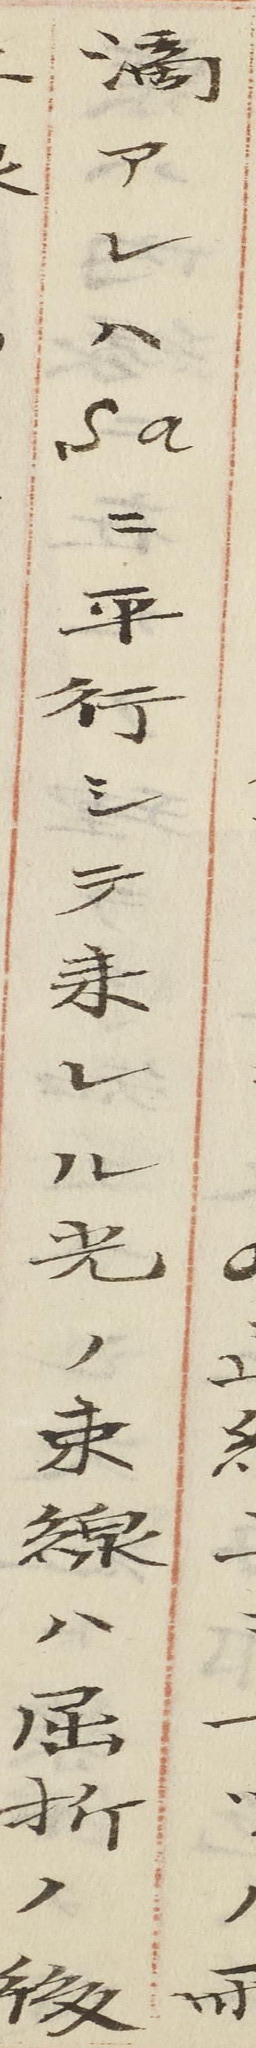滴アレハニ平行シテ来レル光ノ束線ハ屈折ノ後
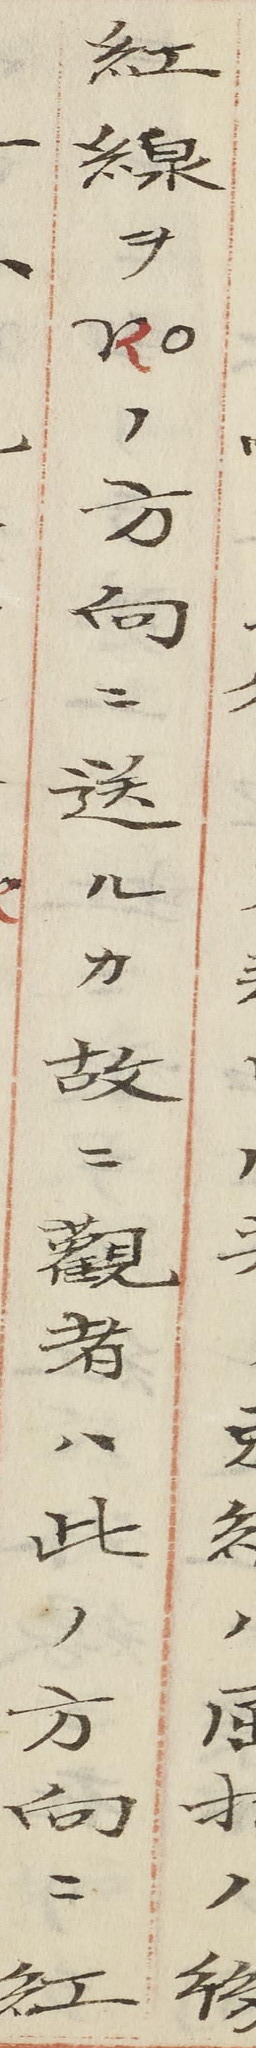紅線ヲノ方向ニ送ルカ故ニ観者ハ此ノ方向ニ紅
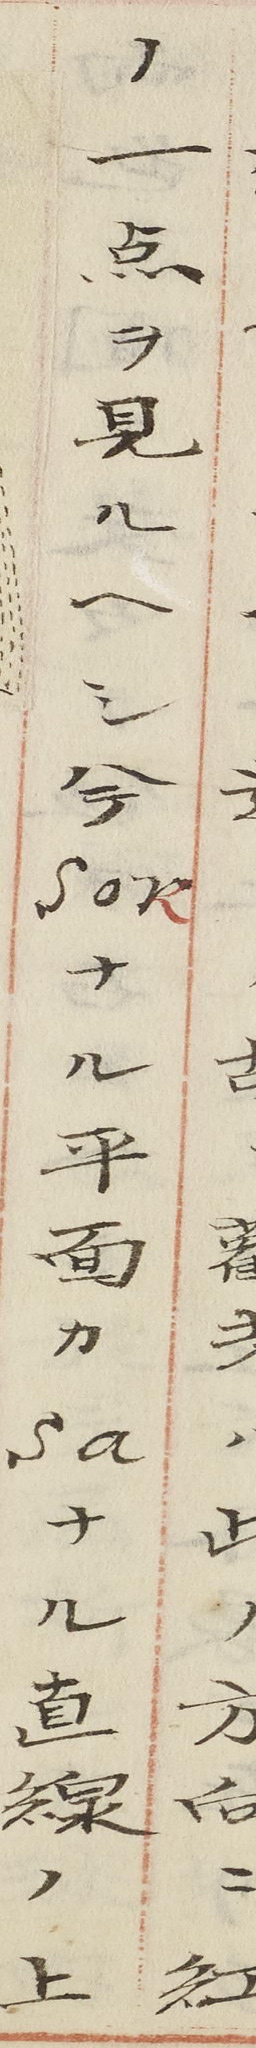ノ一点ヲ見ルヘシ今ナル平面カナル直線ノ上
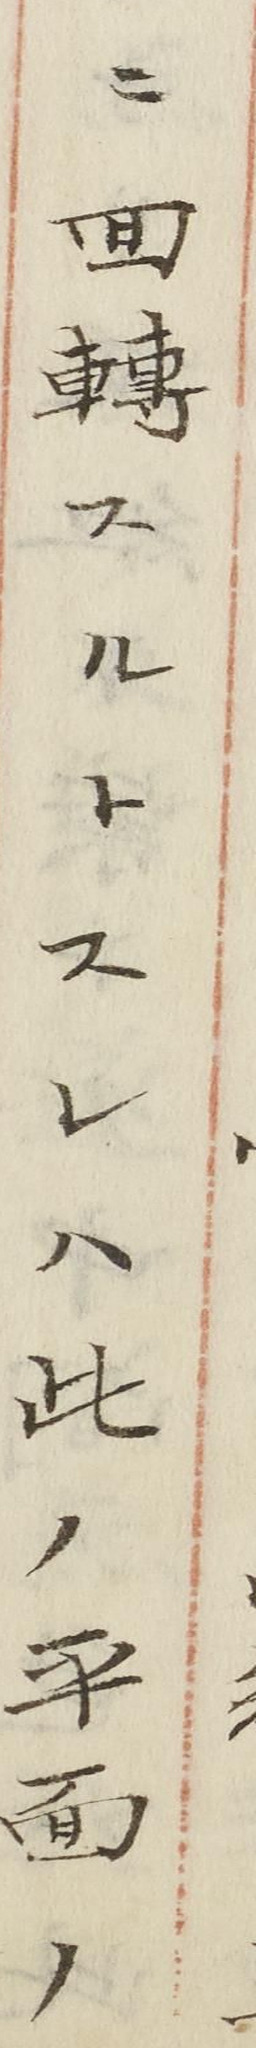ニ回転スルトスレハ此ノ平面ノ
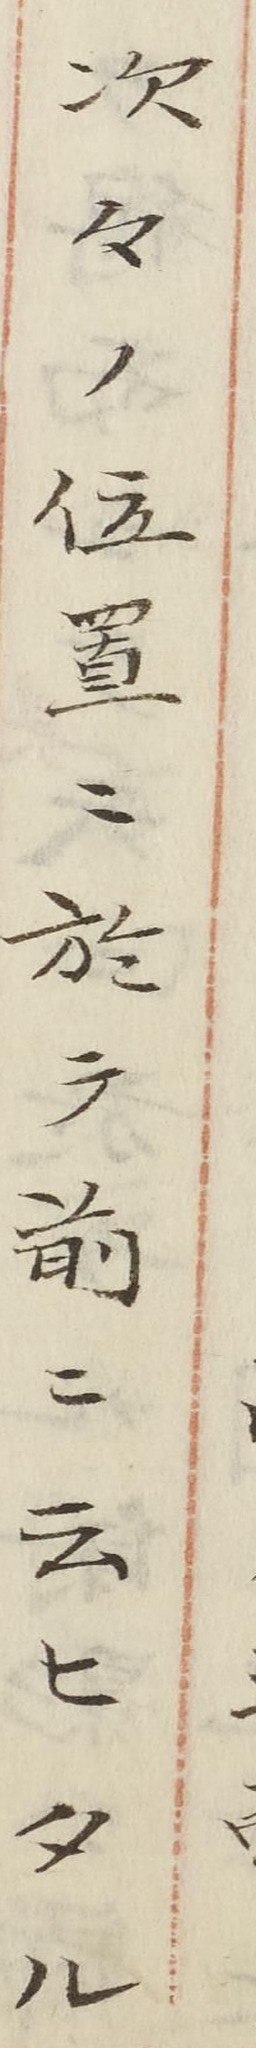第次々ノ位置ニ於テ前ニ云ヒタル
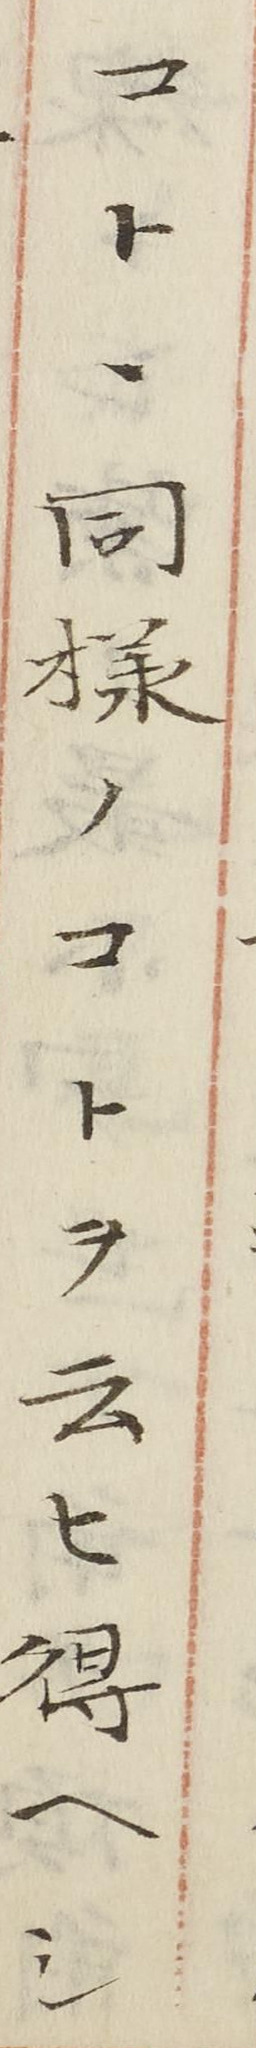コトヽ同様ノコトヲ云ヒ得ヘシ
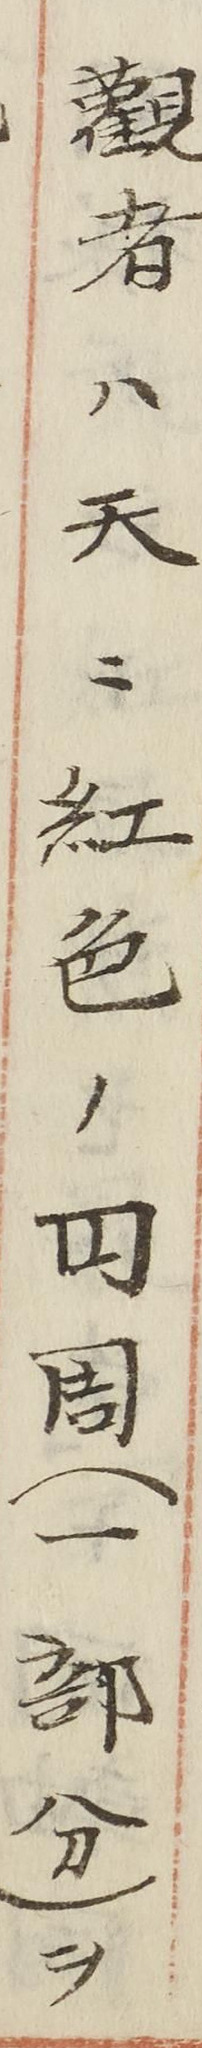四観者ハ天ニ紅色ノ円周ヲ
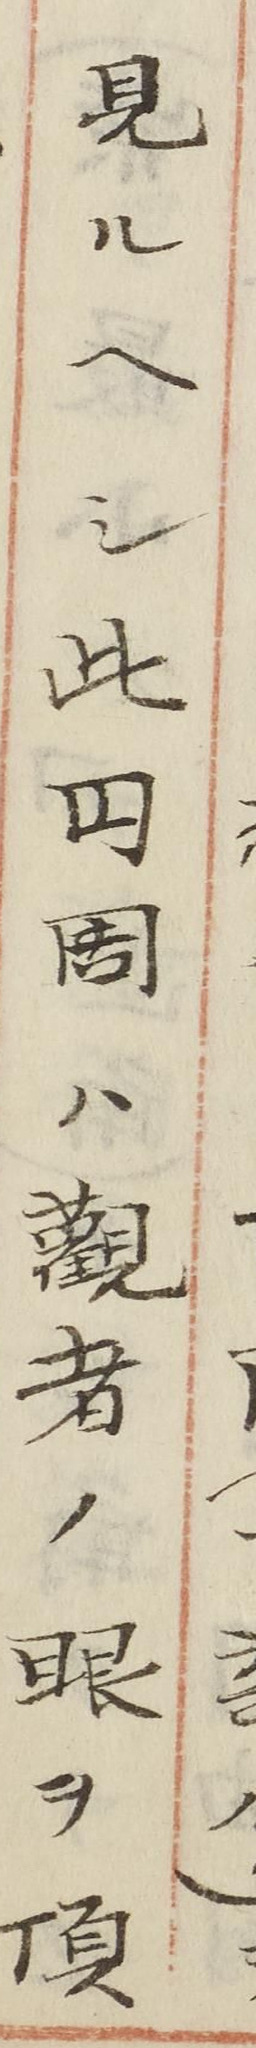見ルヘシ此円周ハ観者ノ眼ヲ頂
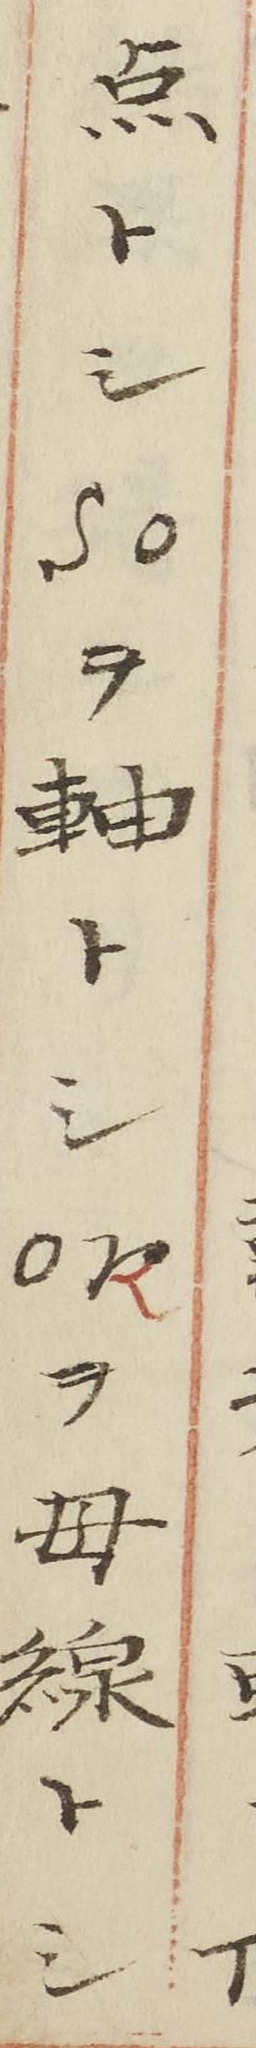図点トシヲ軸トシヲ母線トシ
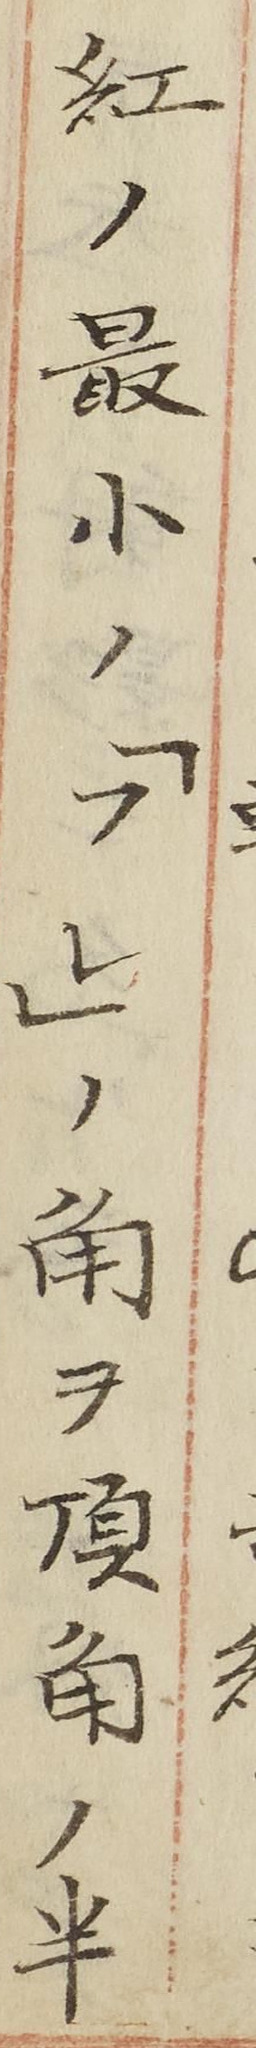紅ノ最小ノ「フレ」ノ角ヲ頂角ノ半
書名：虹及ハロノ説明
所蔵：東京大学地震研究所図書室 Earthquake Research Institute Library, The University of Tokyo, JAPAN
